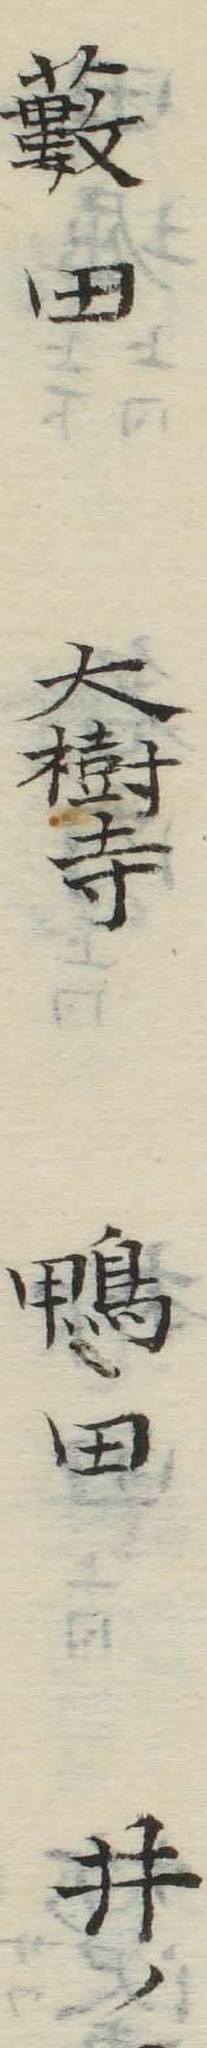藪田大樹寺鴨田井ノ口
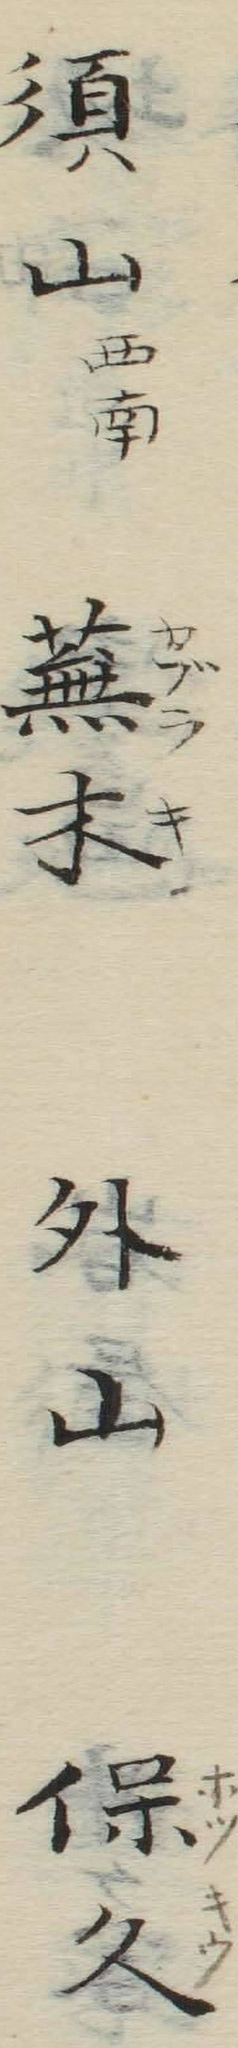須山西南蕪木外山保久
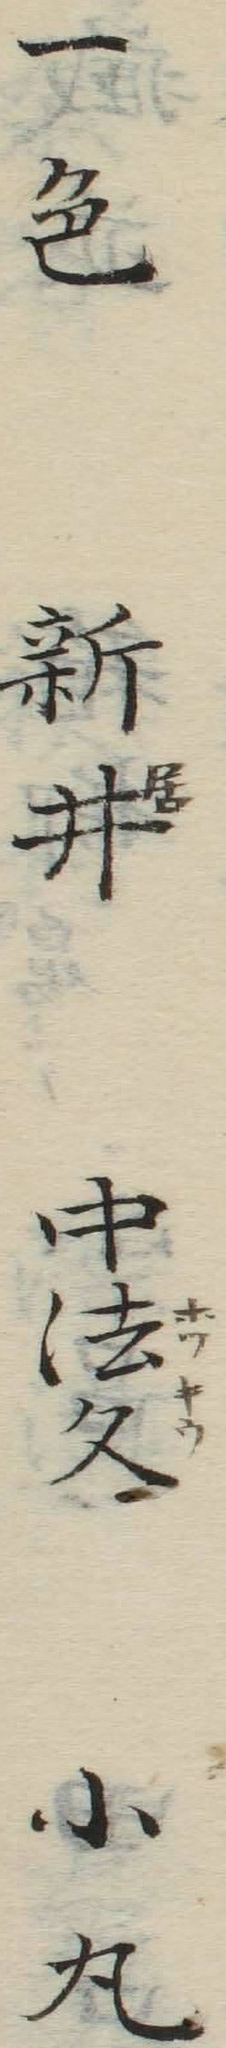一色新井中法久小丸

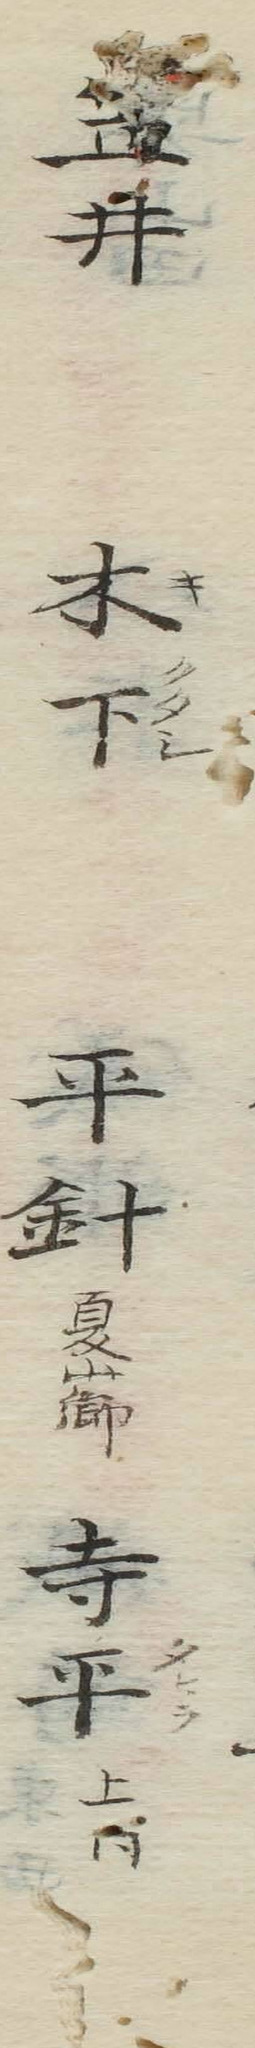井木下平針夏山郷寺平上同
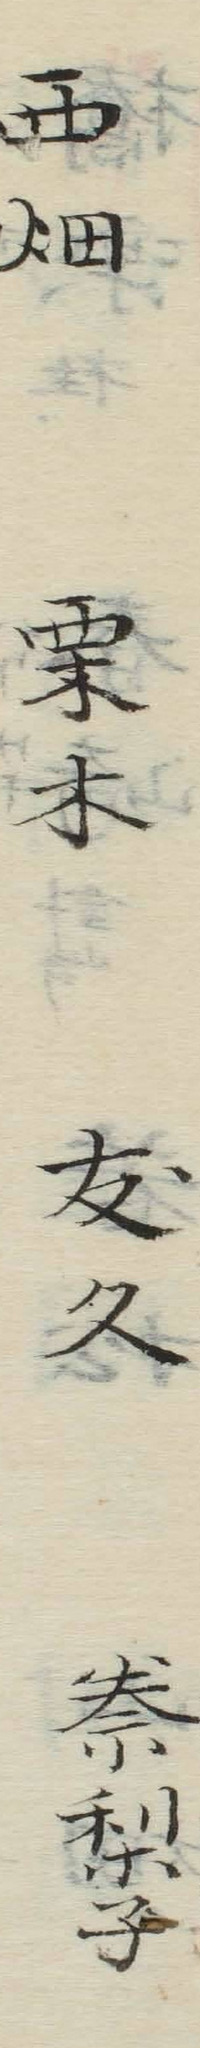西畑栗木友久梨子
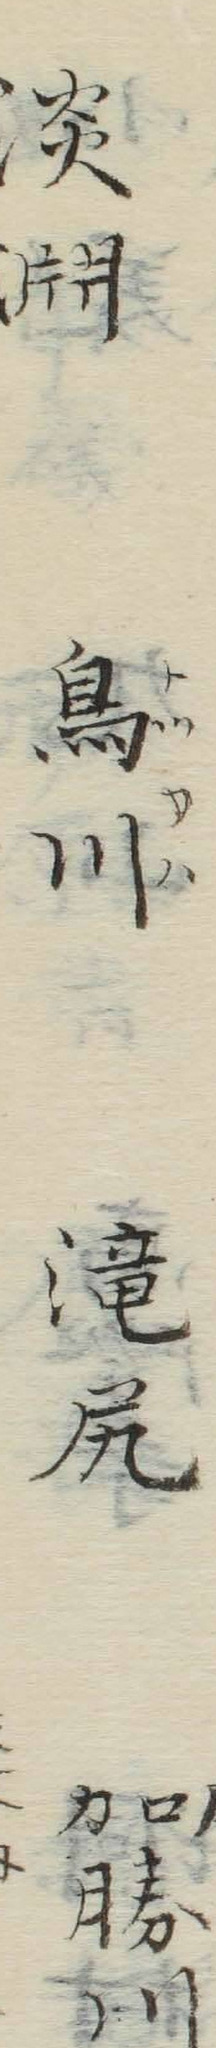淡淵鳥川滝尻加勝川
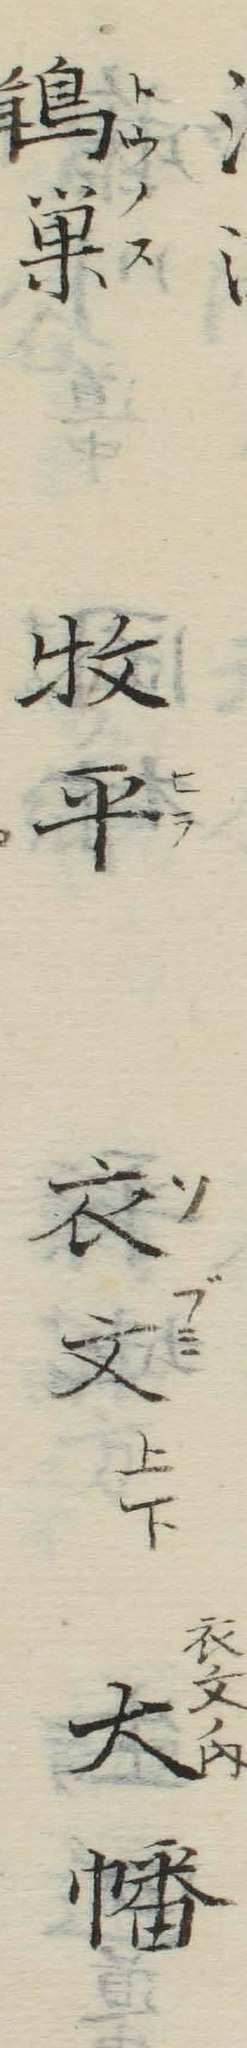鵇巣牧平衣文上下大幡
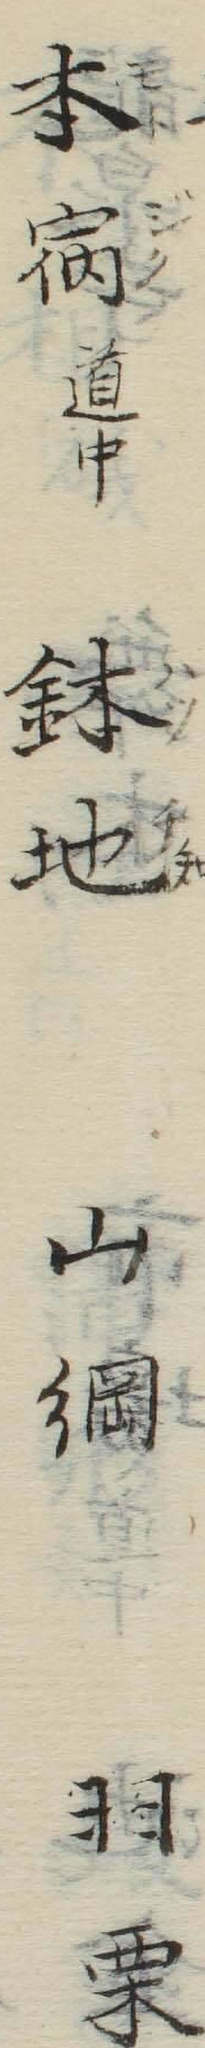本宿道中鉢地山綱羽栗

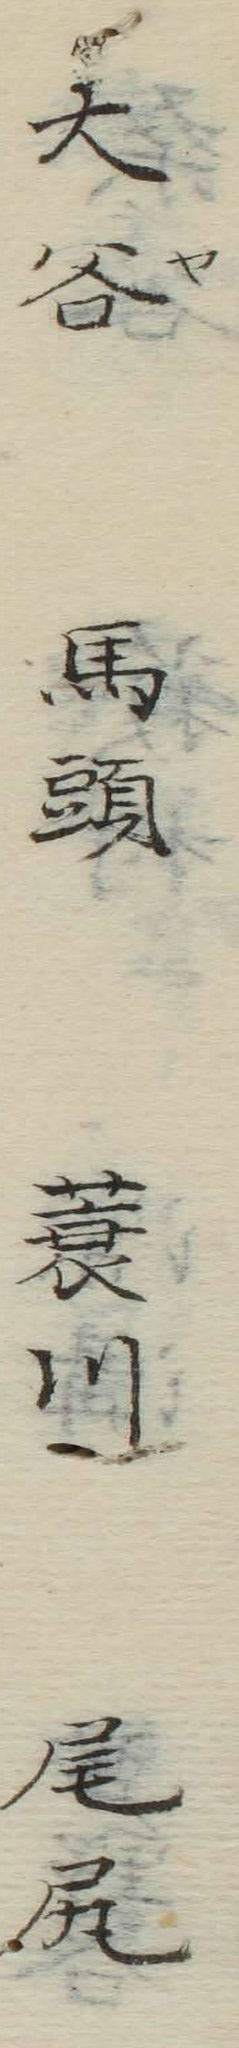大谷馬頭蓑川尾尻
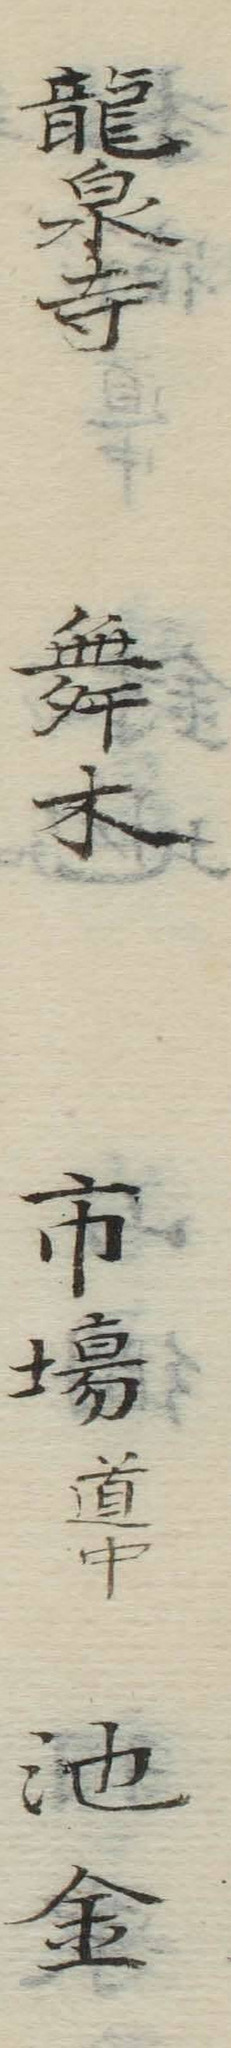龍泉寺舞木市場道中池金
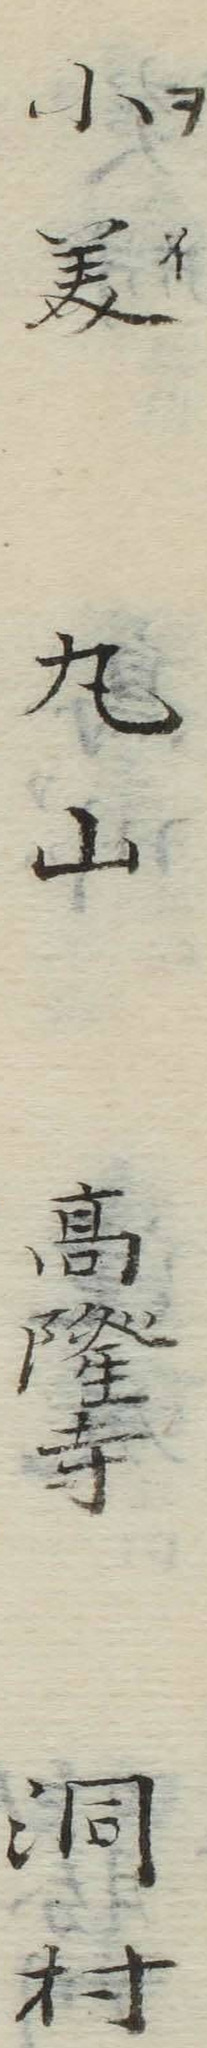小美丸山髙隆寺洞村
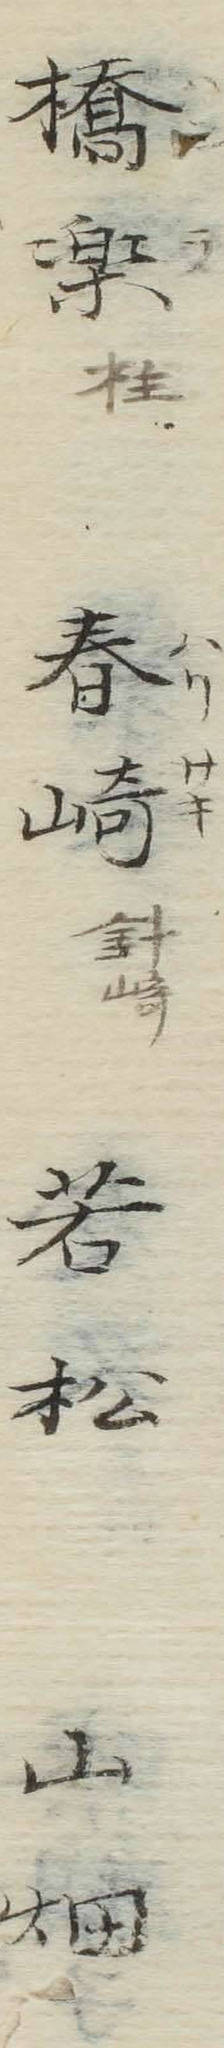橋楽柱春﨑針﨑若松山畑
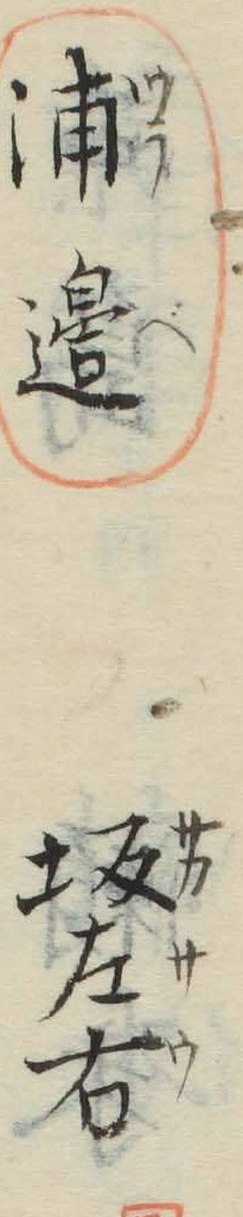浦邊坂左右
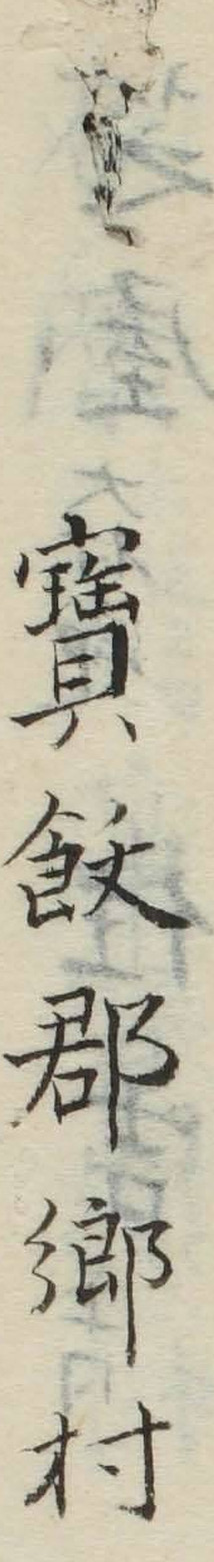寶飫郡郷村
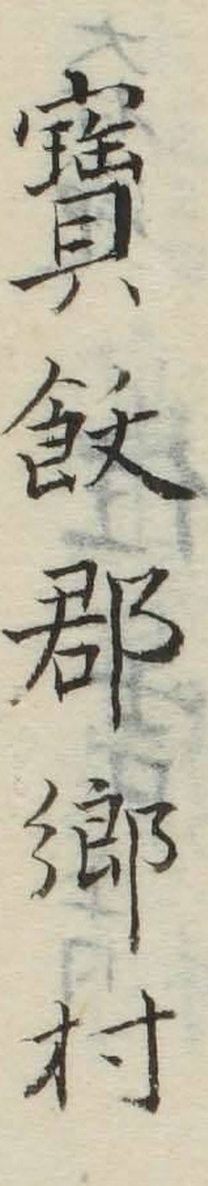寶飫郡郷村
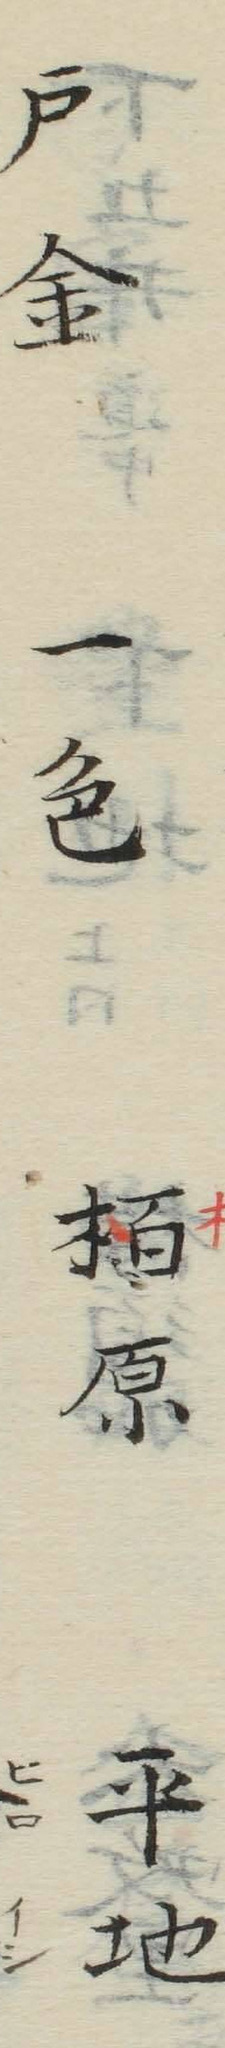戸金一色栢柏原平地
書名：三河国二葉松
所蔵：国文学研究資料館
